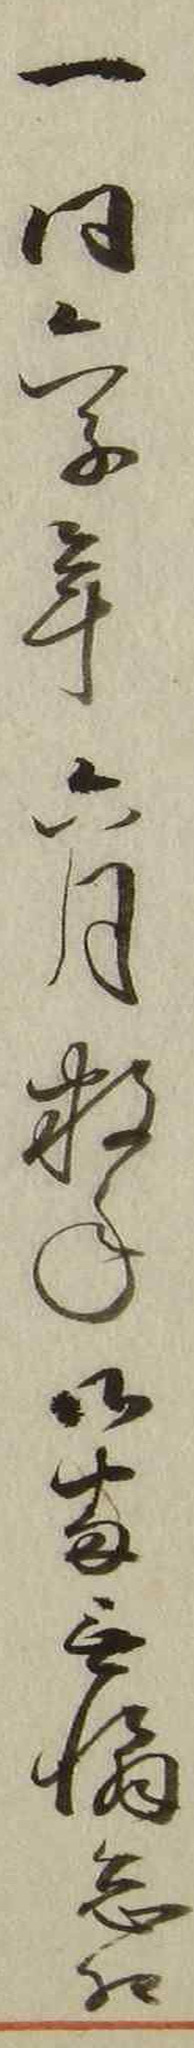一同六子年六月数年御番無懈怠相
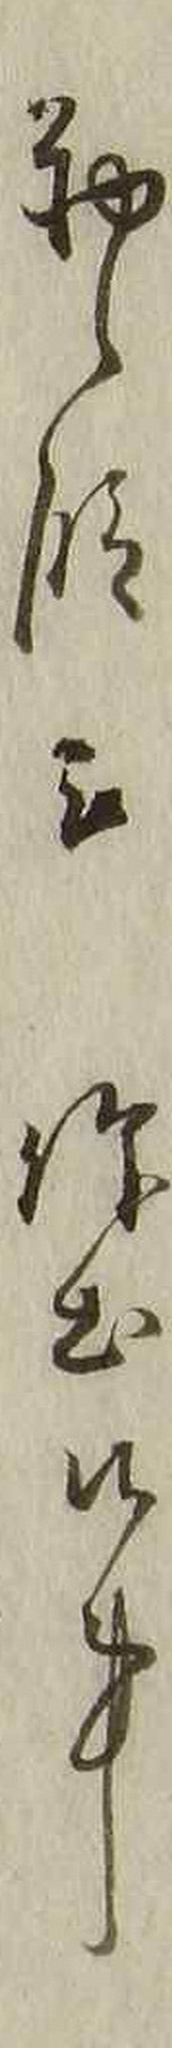勤候段被仰出候事
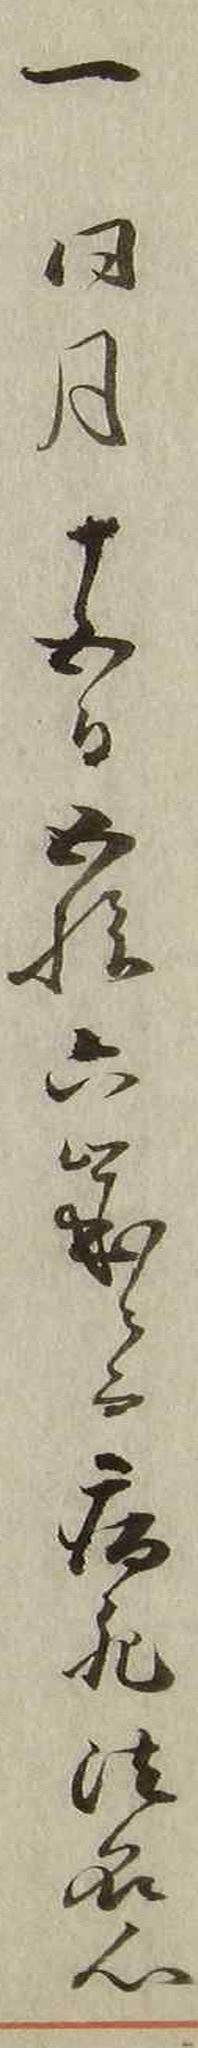一同月十五日五拾六歳ニ而病死法名心
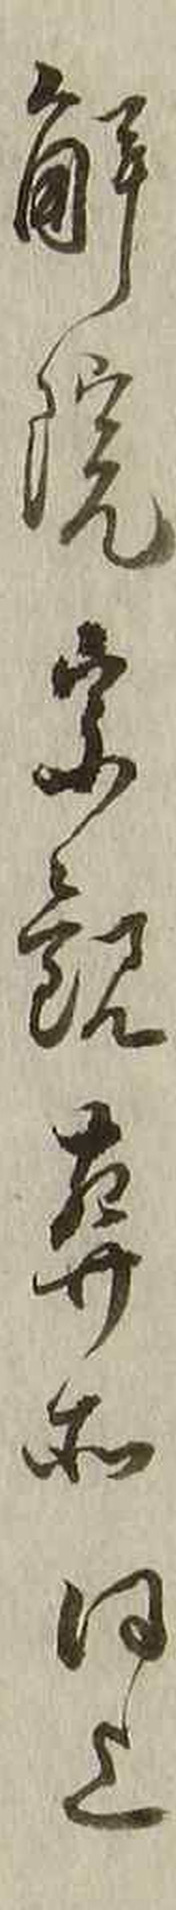解院宗観葬所同上
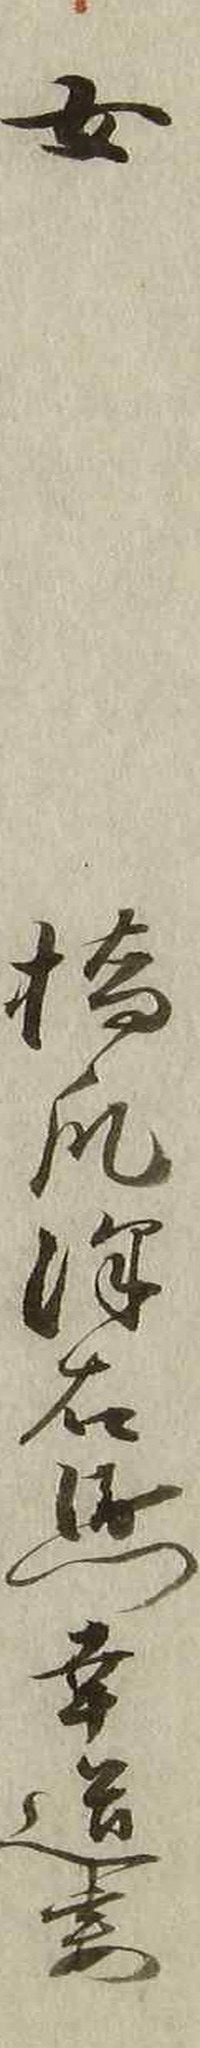女橋爪澤右衛門幸道妻
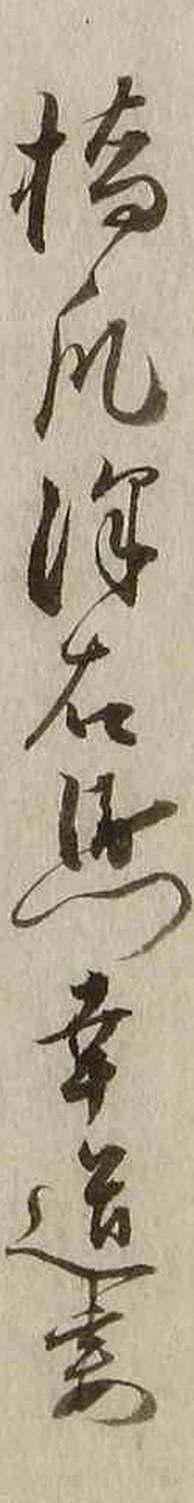女橋爪澤右衛門幸道妻
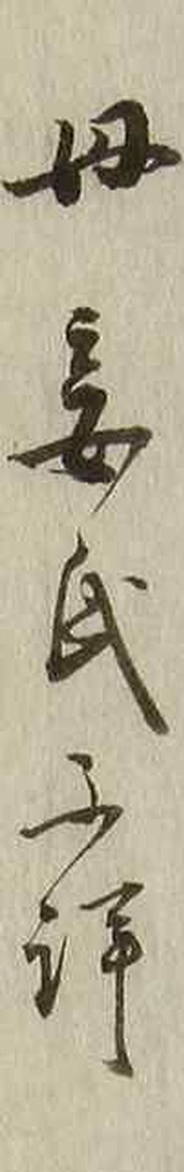母妄氏不詳
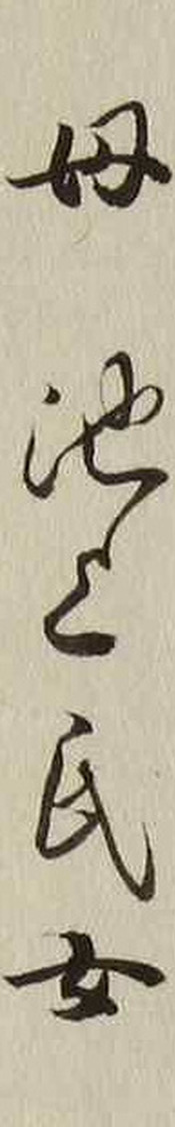母池上氏女
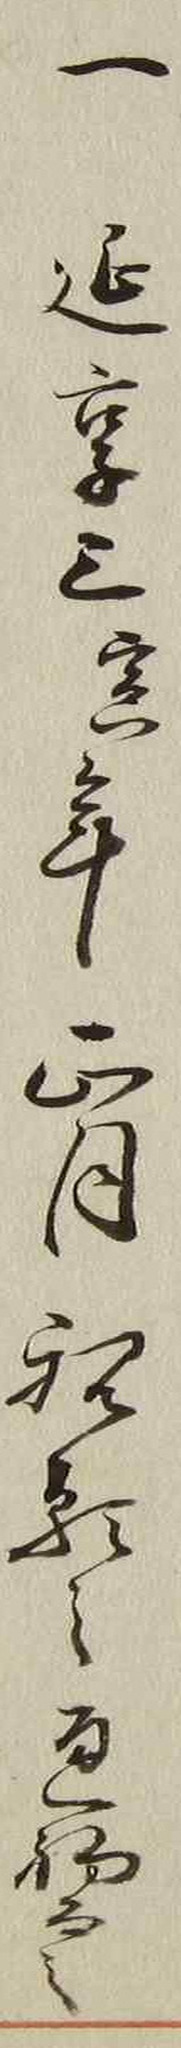一延享三寅年正月親願之通初而之
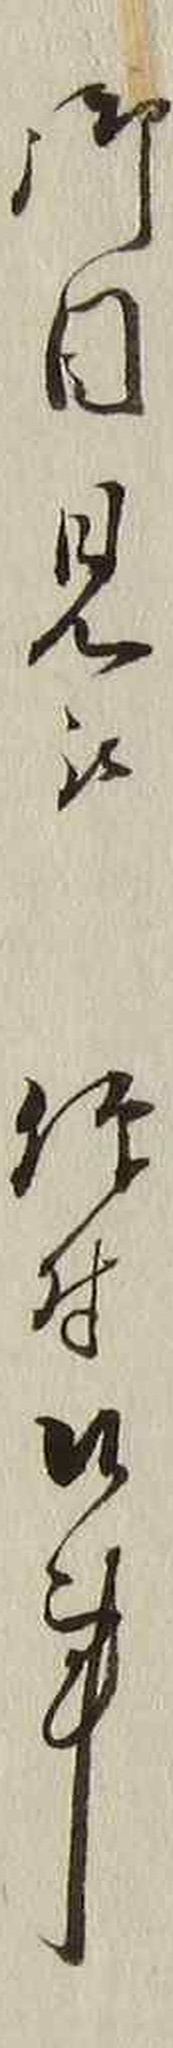御目見被仰付候事
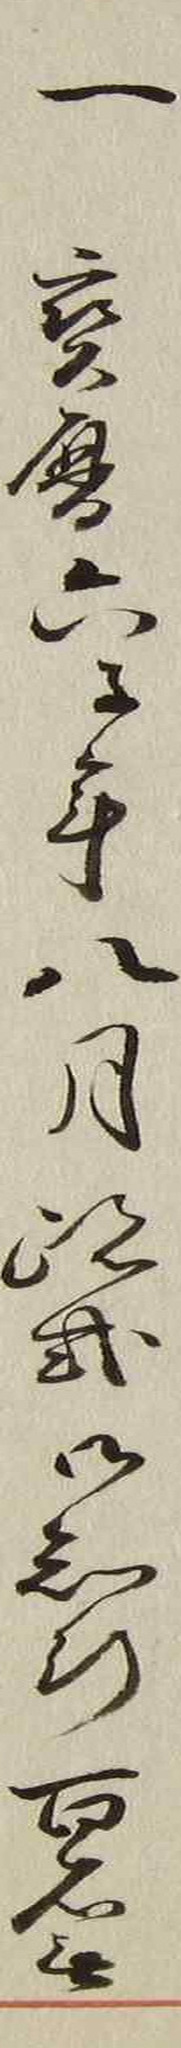一宝暦六子年八月跡式御知行百石無
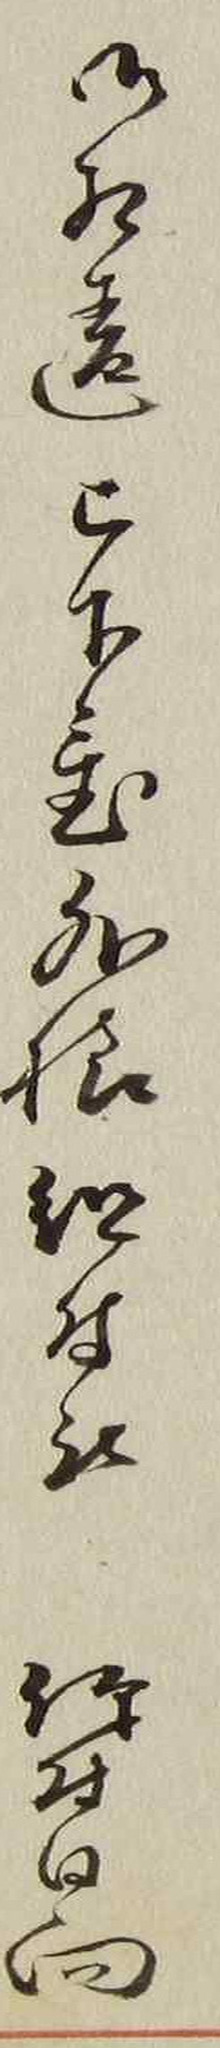御相違被下置外様組付被仰付日向
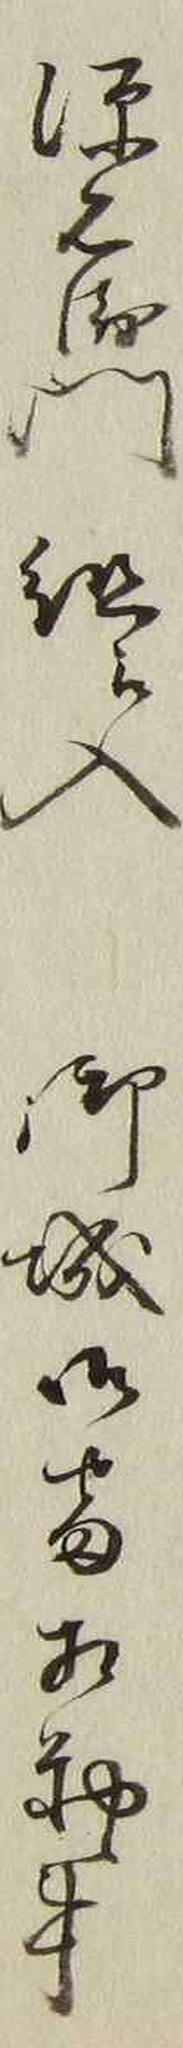源右衛門組江入御城御番相勤候事
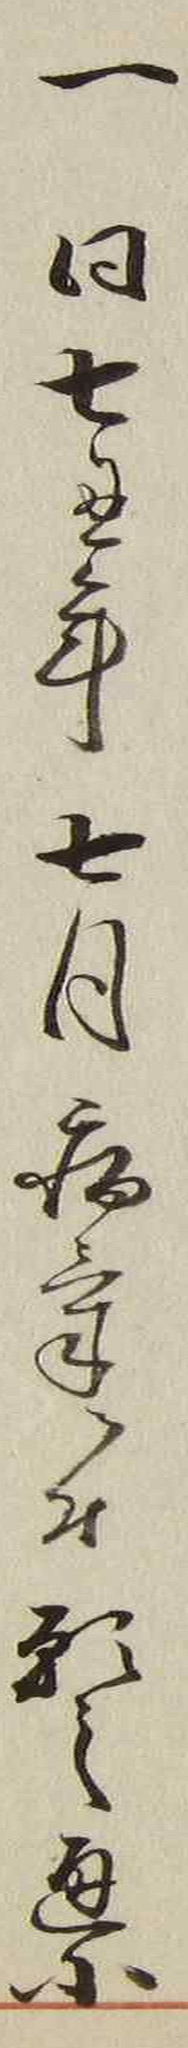一同七丑年七月病気ニ付願之通小
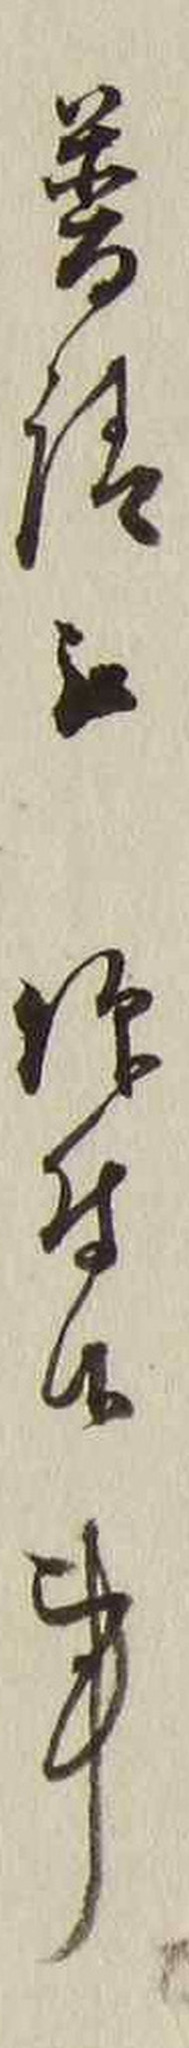普請被仰付候事

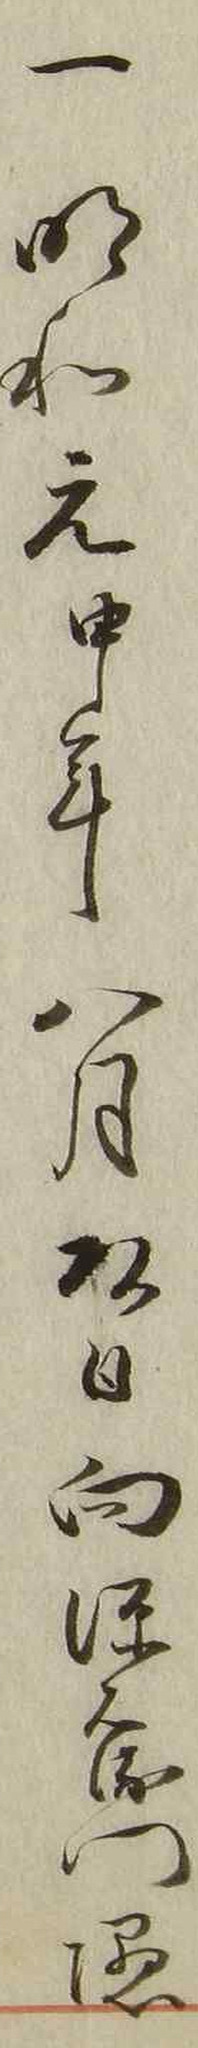一明和元申年八月頭日向源右衛門隠
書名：諸士系譜　巻之26　い之部26
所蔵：会津若松市立会津図書館
